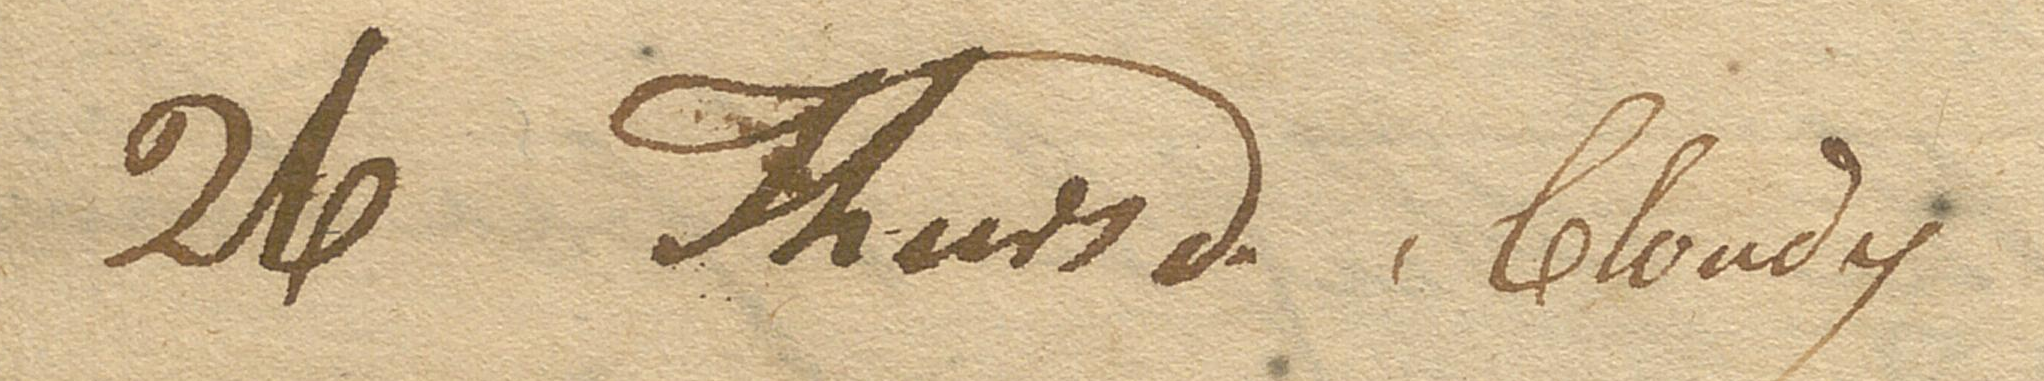26 Thursd. Cloudy
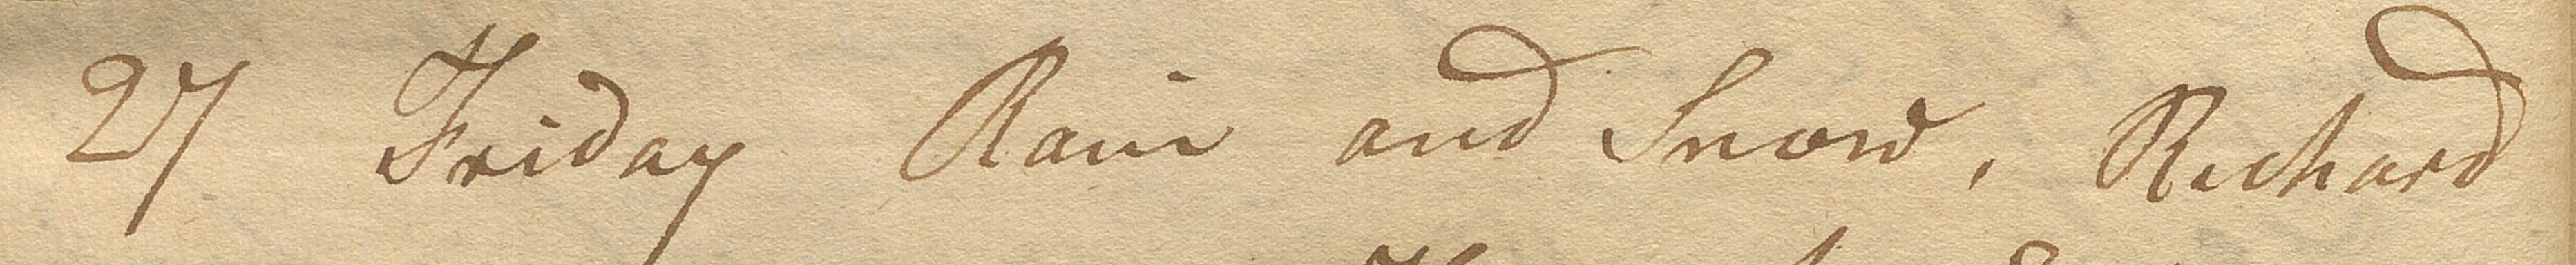27 Friday Rain and Snow, Richard
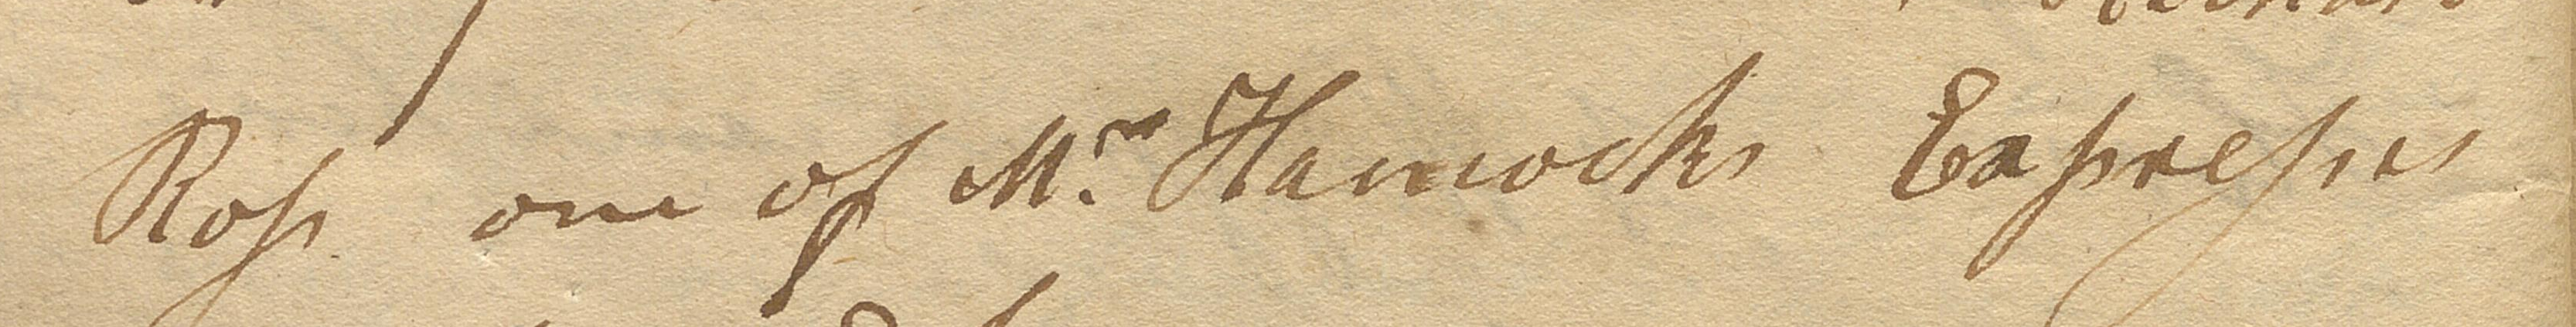Ross one of M^r. Hancocks Expresses
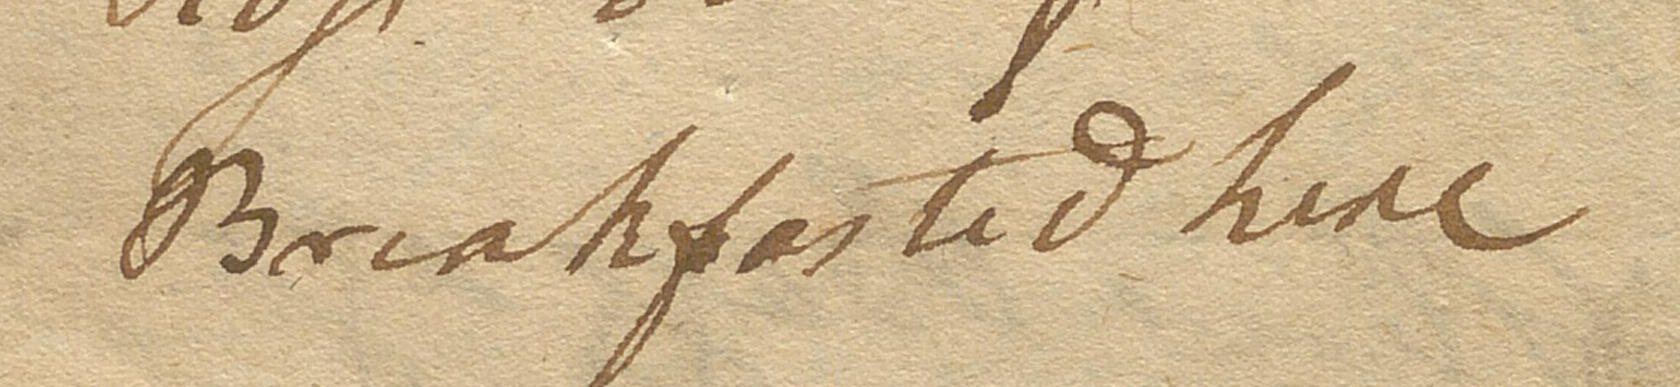Breakfasted here
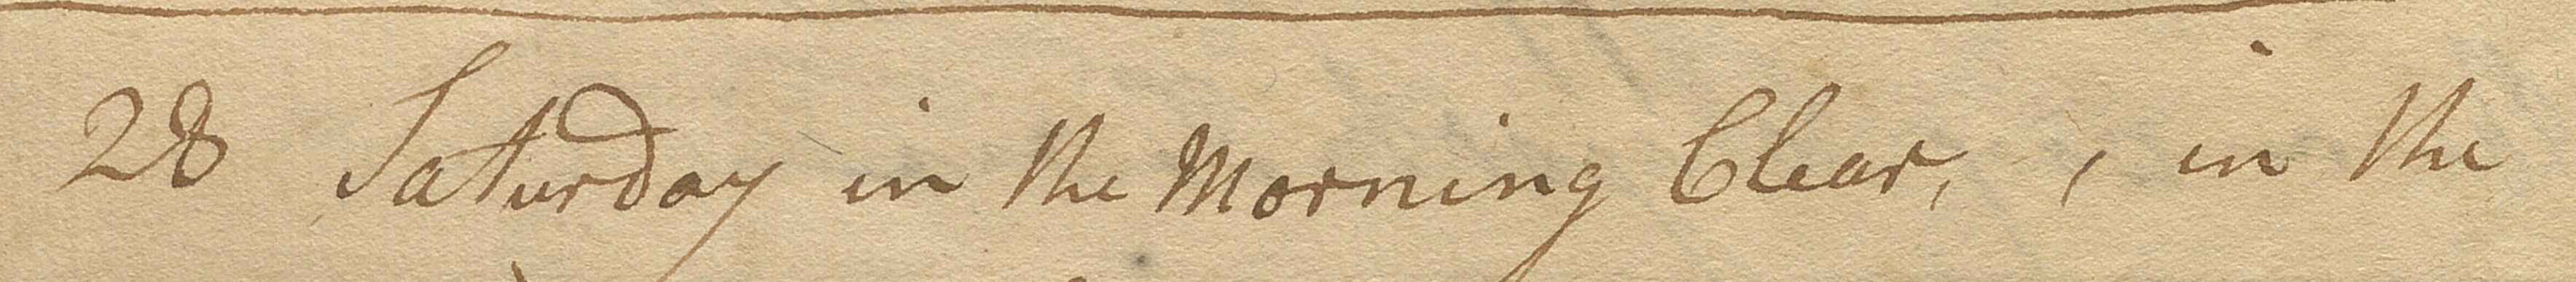28 Saturday in the Morning Clear, in the
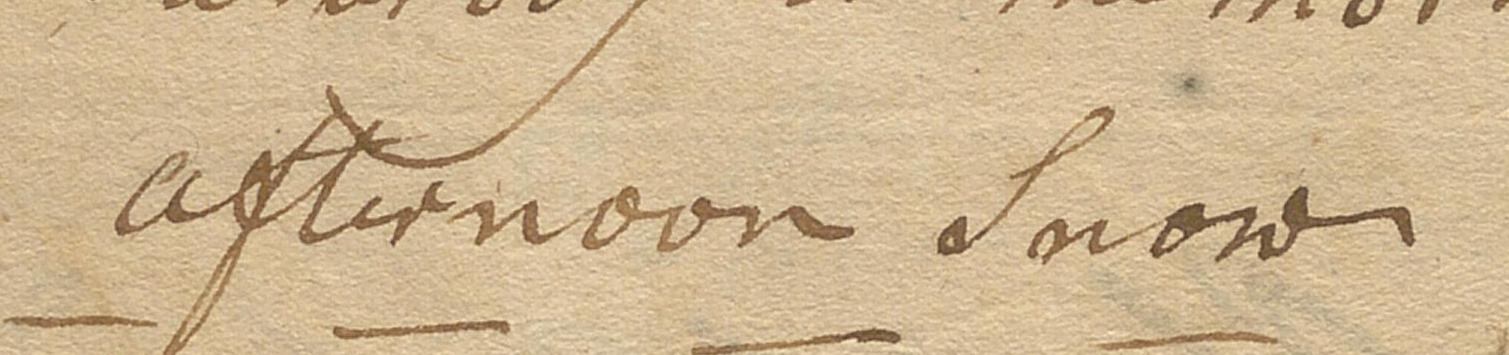afternoon Snow
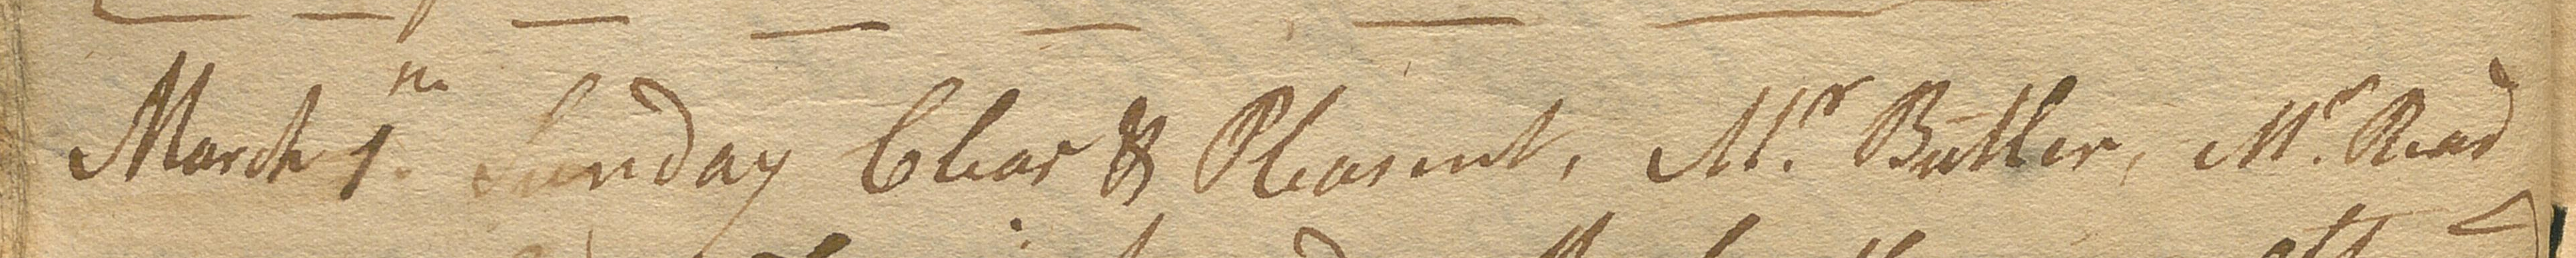March 1^th. Sunday Clear & Pleasent, M^r. Butler, M^r. Read
